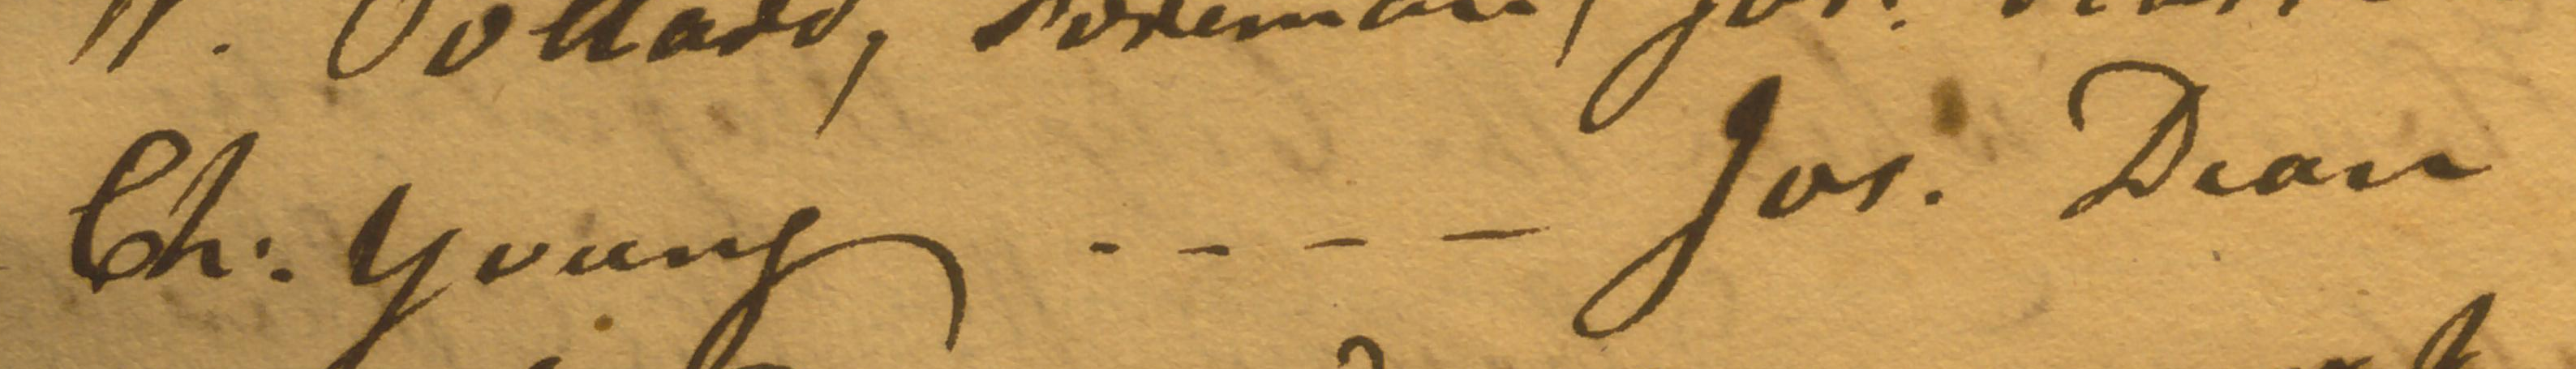Ch. young.---- Jos. Dean
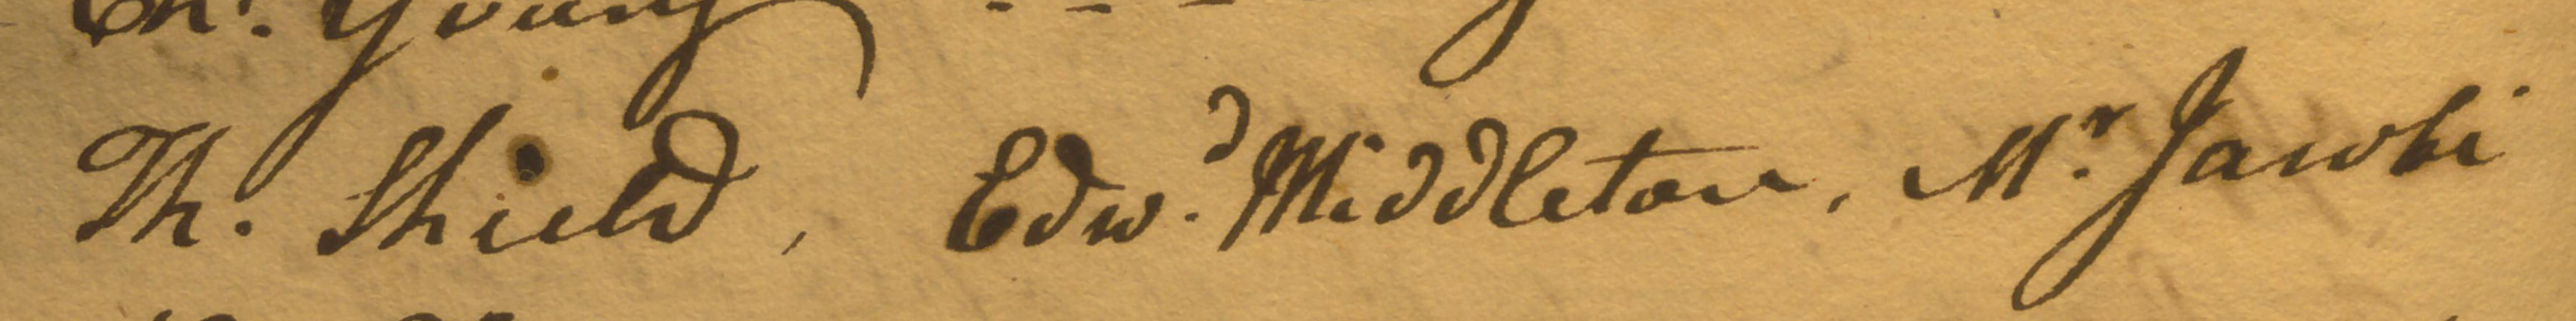Th. Shield, Edw^d. Middleton, M^r. Jacobi
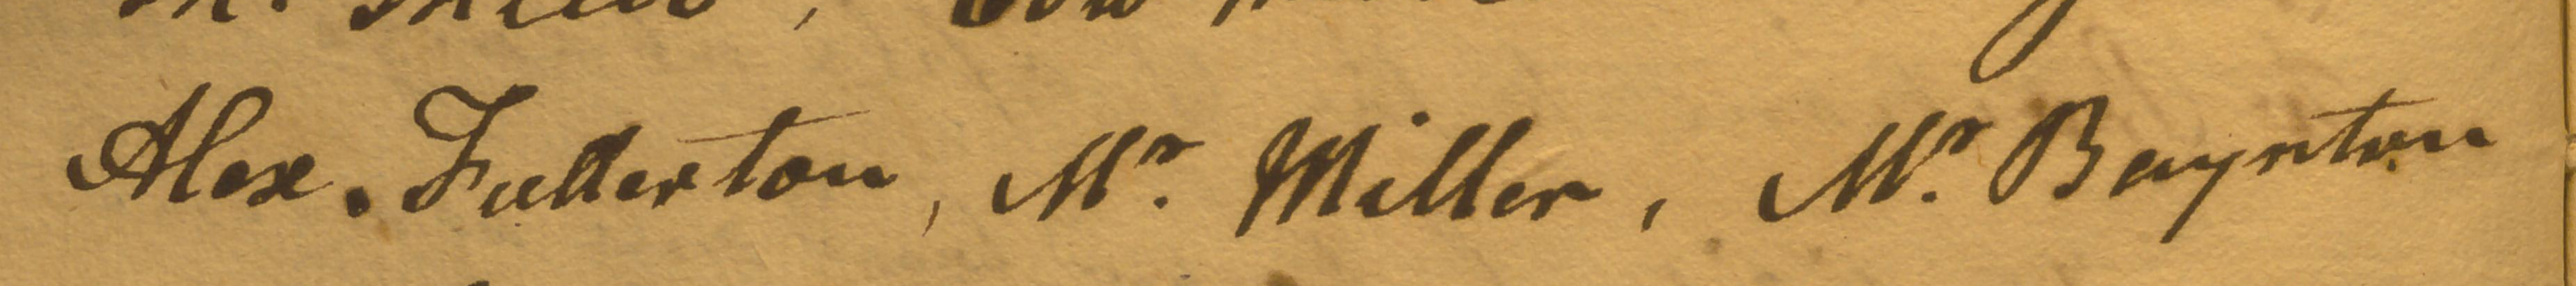Alex. Fuderton, M^r. Miller, M^r. Baynton
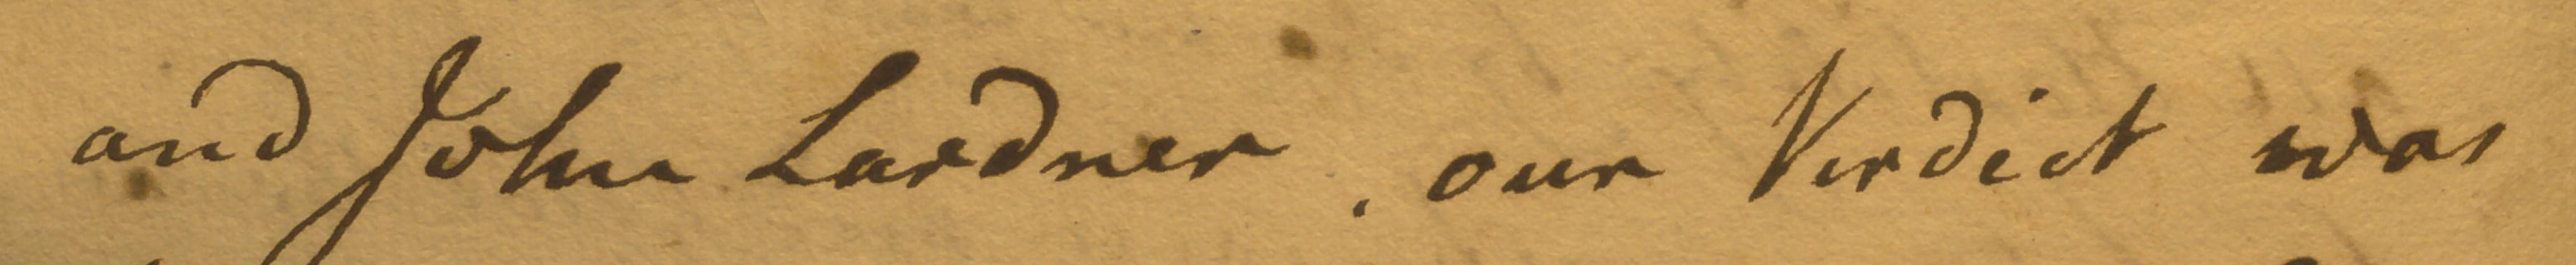and John Lardner our Verdict was
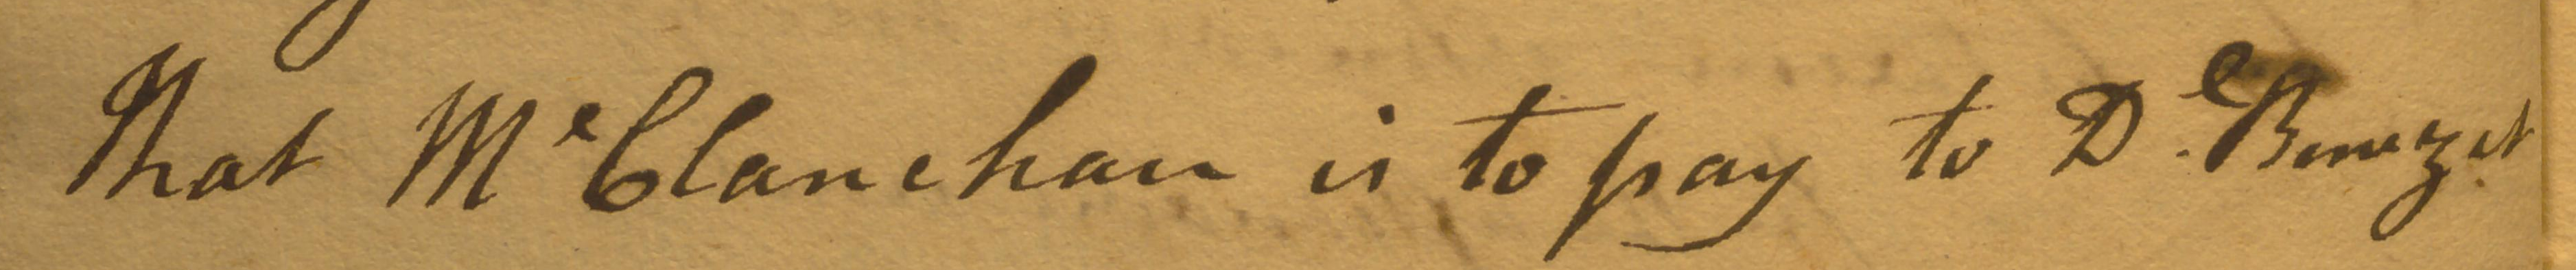that M^cClanchan is to pay to D^l. Benezet
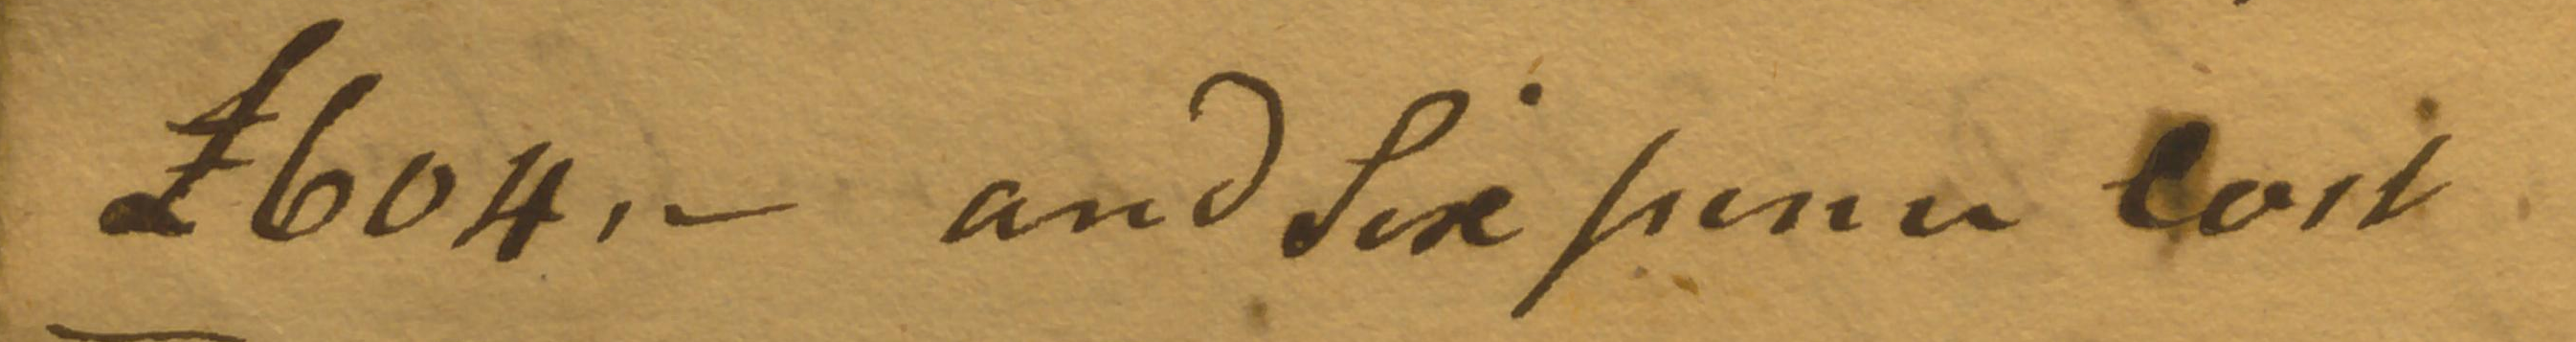£604.- and Six pence Cost
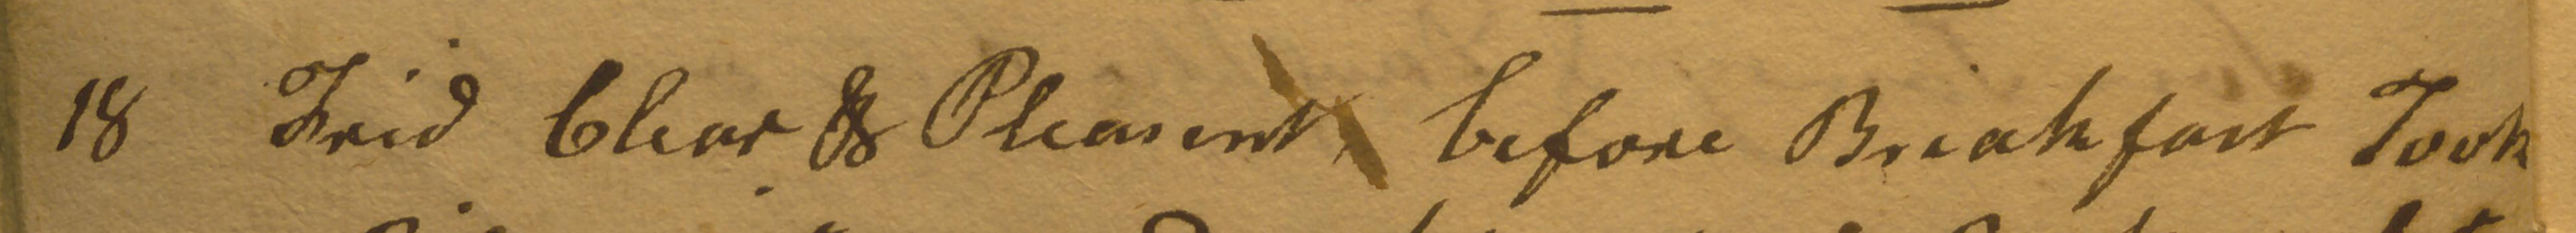18 Frid Clear & Pleasent before Breakfast Took
